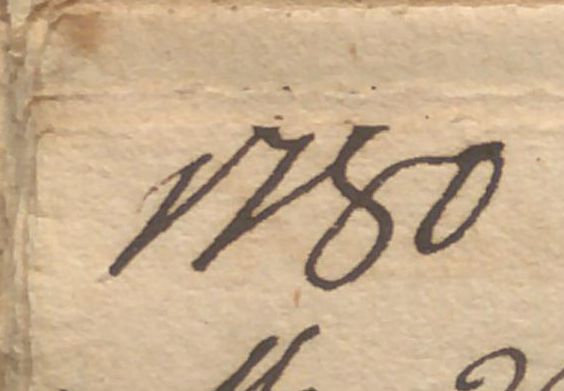1780
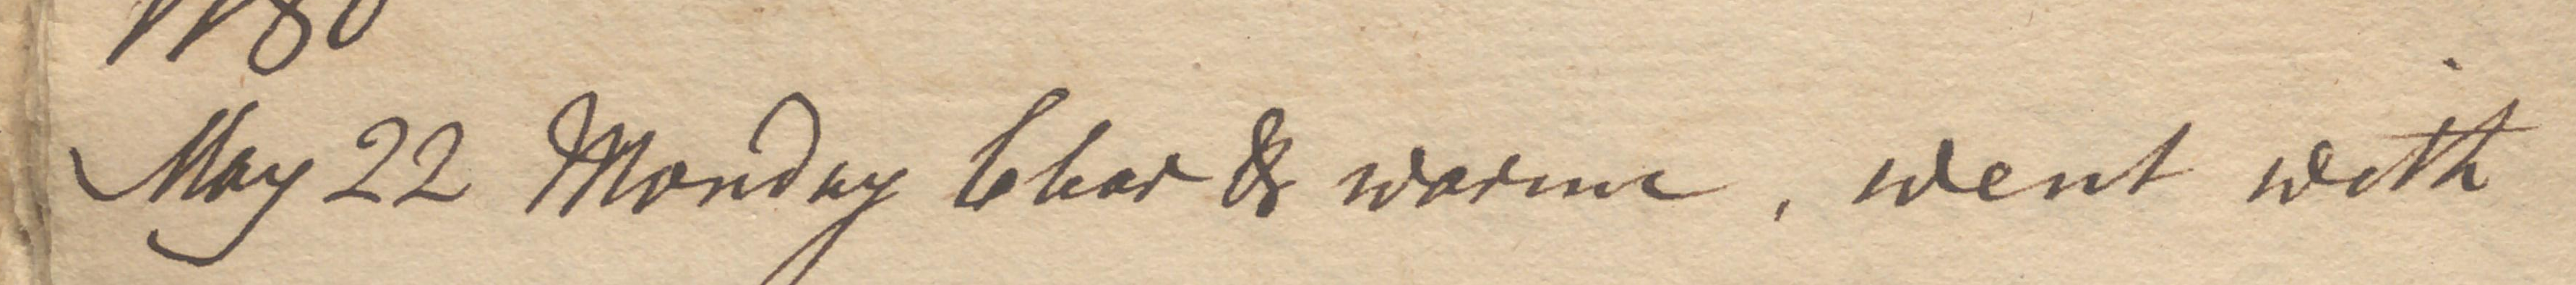May 22h Monday Clear & warme, went with
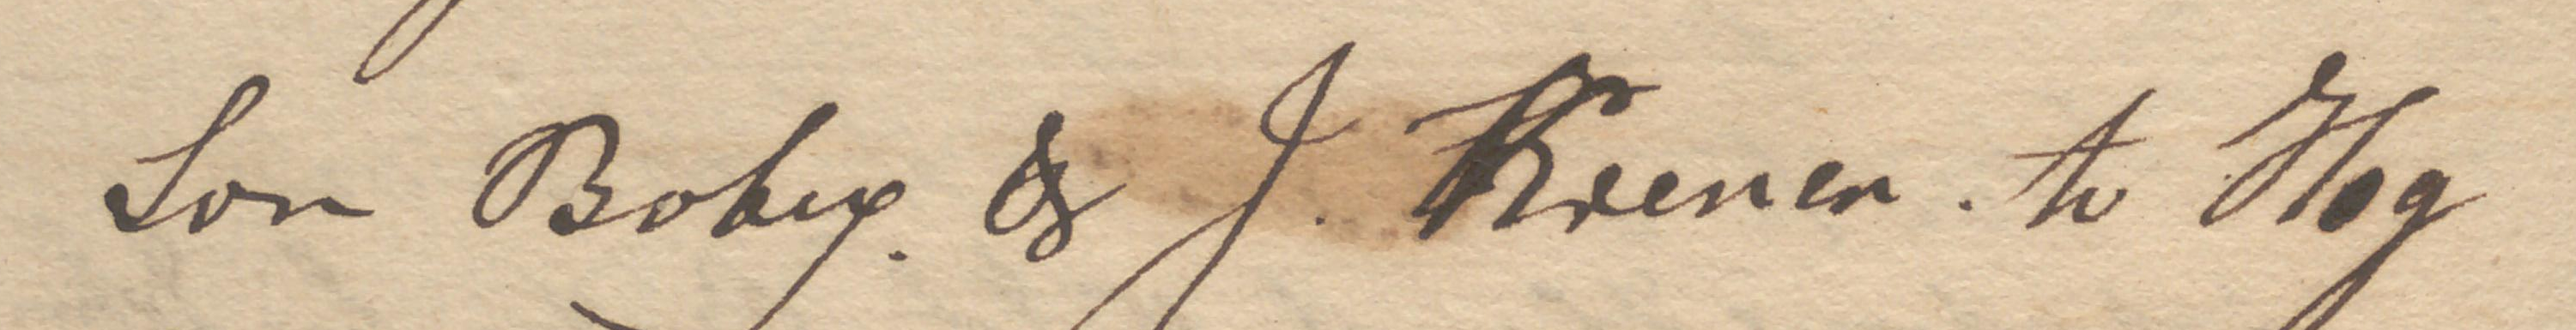Son Bobey & J. Keenen. to Hog
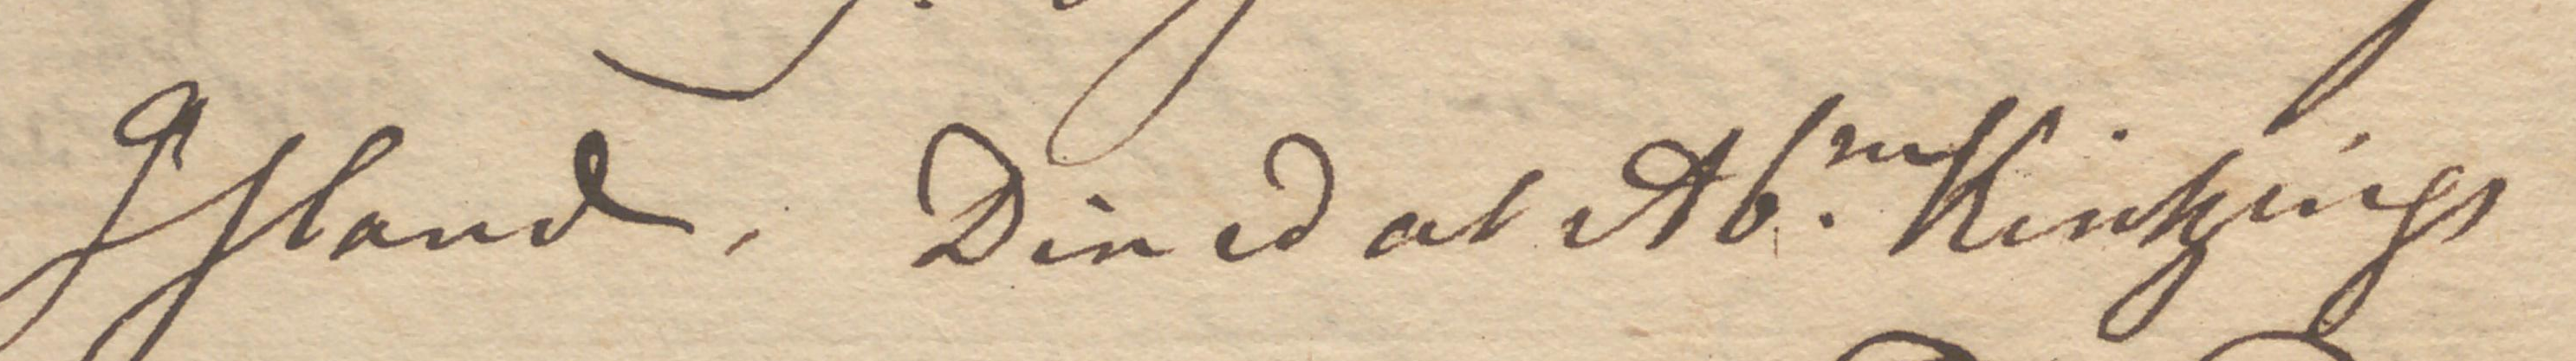Island. Dined at Ab^m. Kintzings
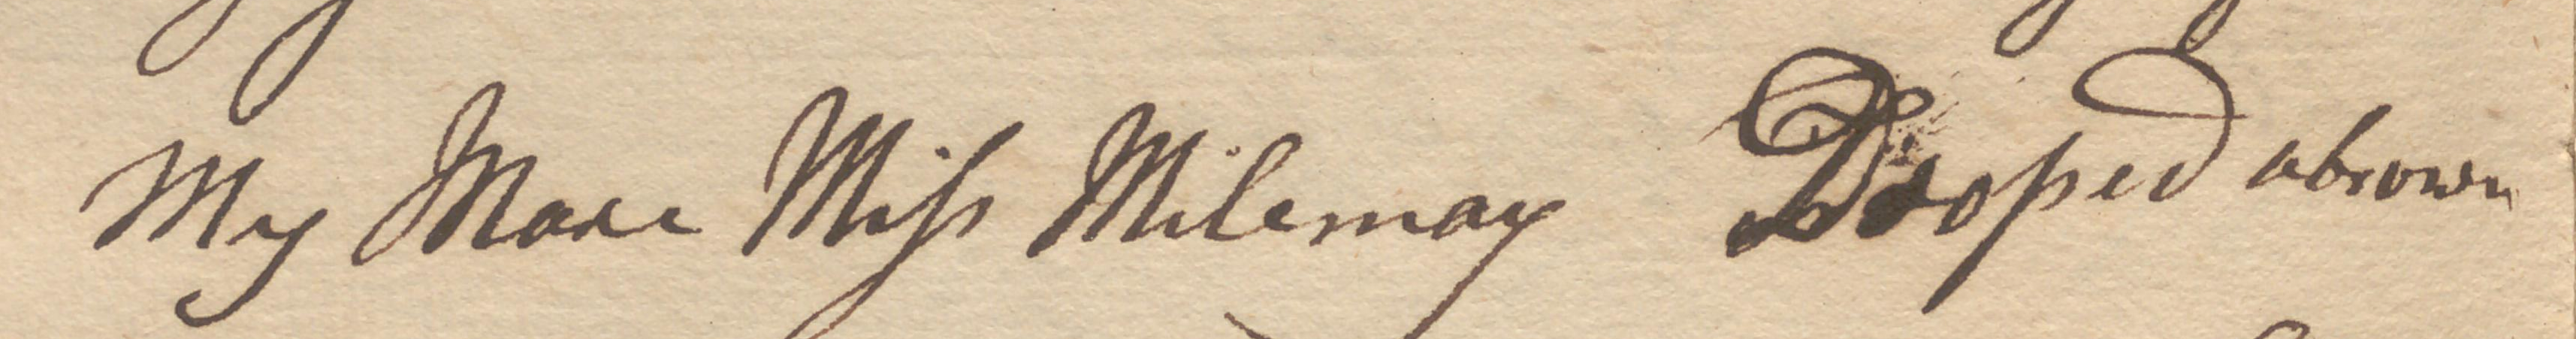My Mare Miss Milemay Droped a brown
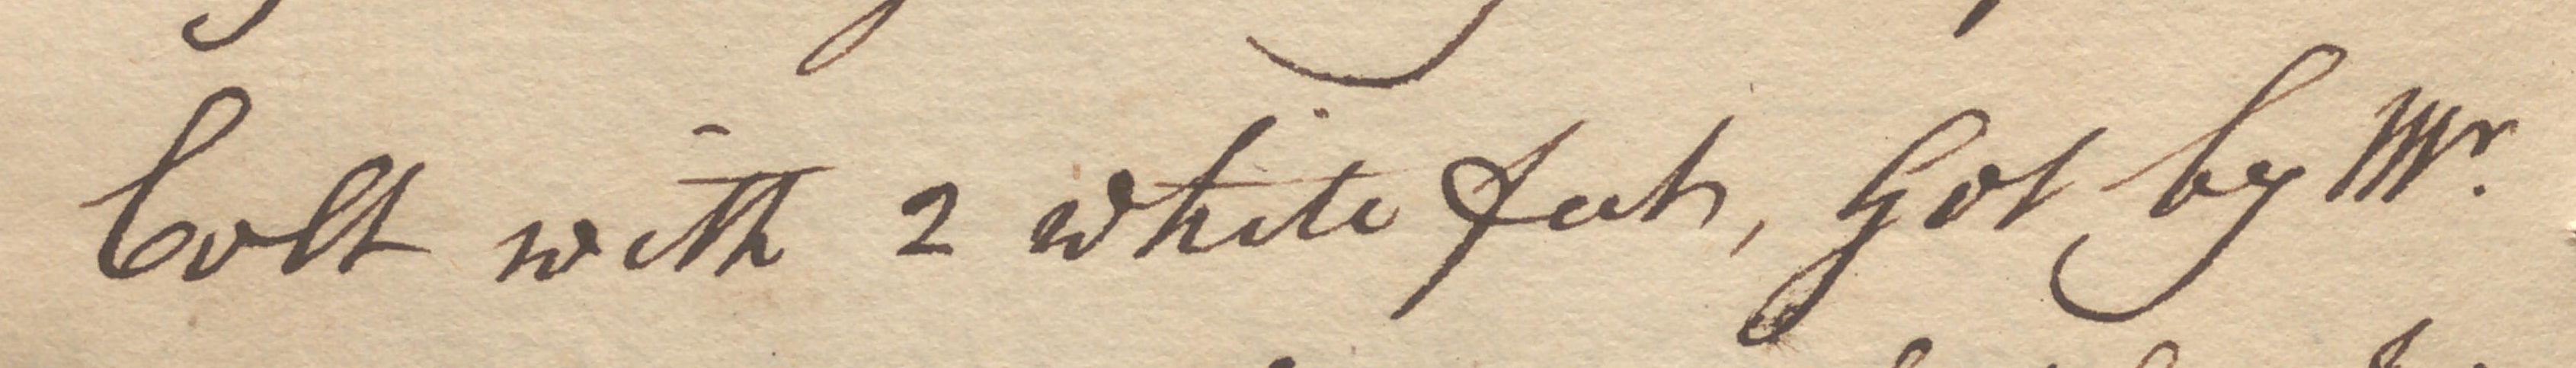Colt with 2 white feet, Got by M^r.
